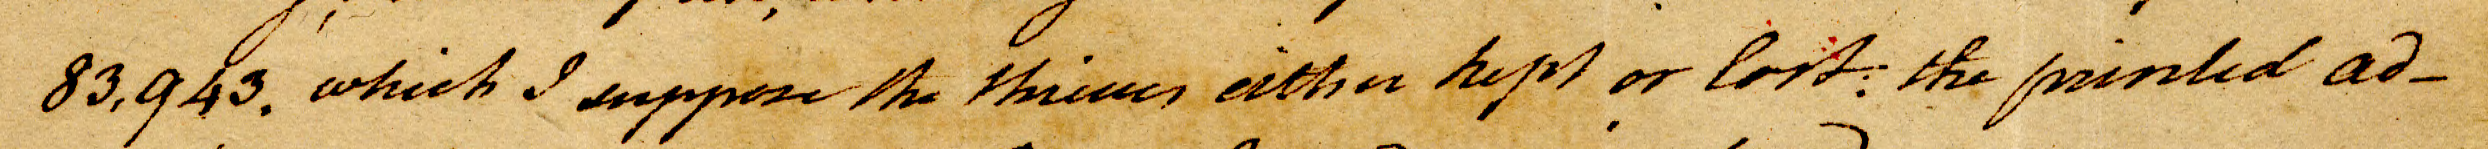83,943. which I suppose the thieves either kept or lost: the printed ad-
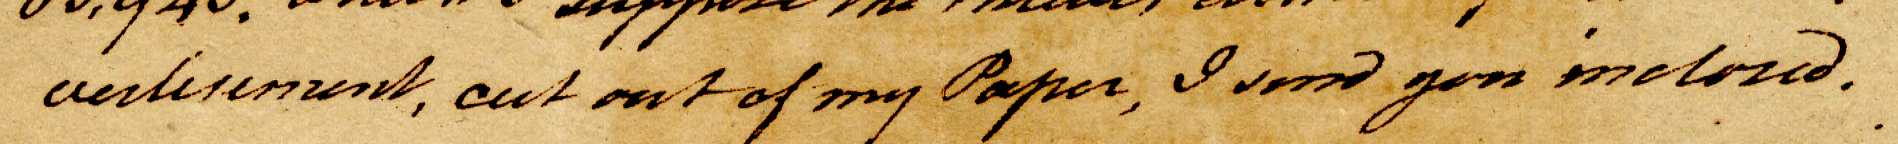vertisement cut out of my Paper, I send you inclosed.
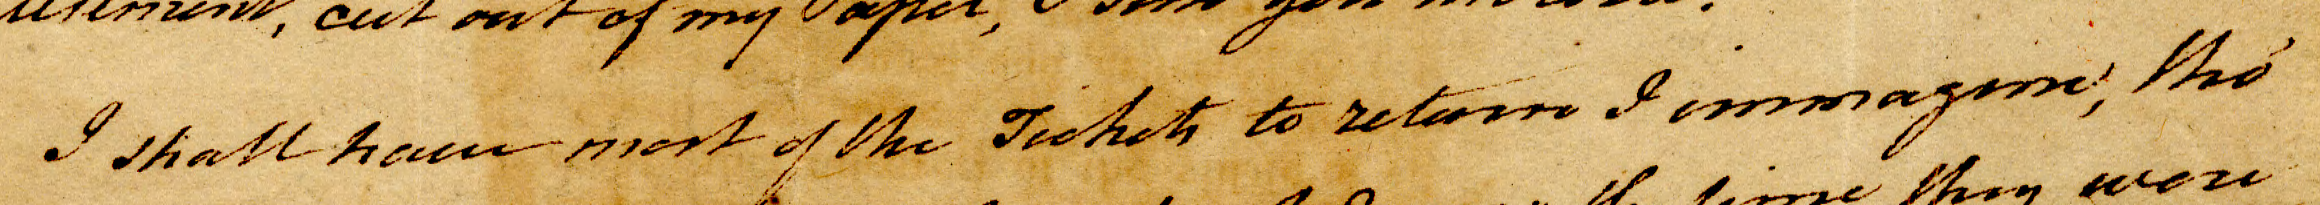I shall have most of the Tickets to return I imagine, tho'
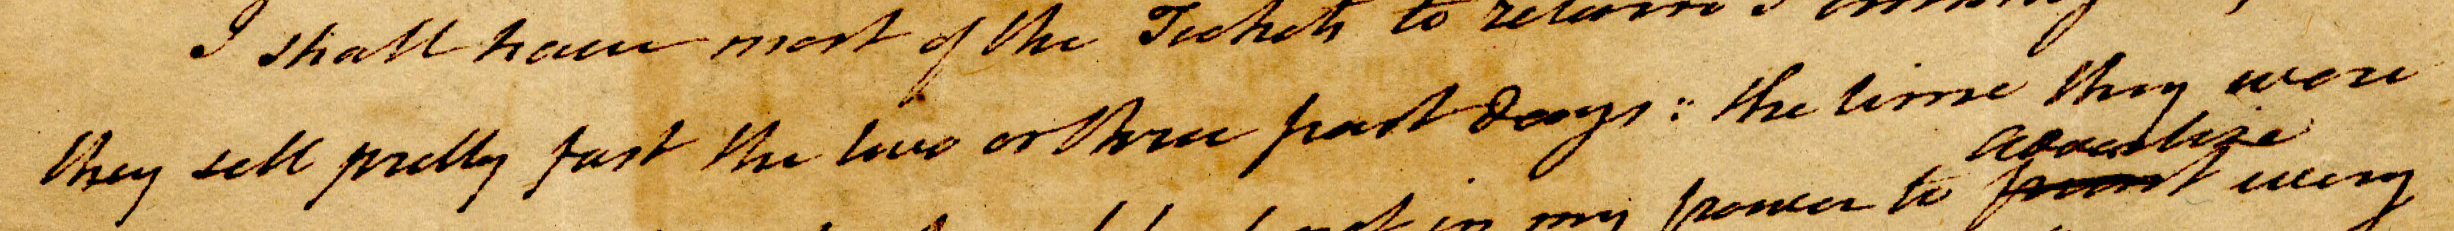they sell pretty fast the five or three past days: the time they were
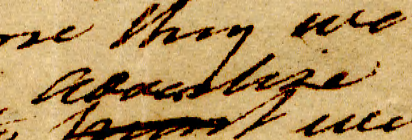aoaulize
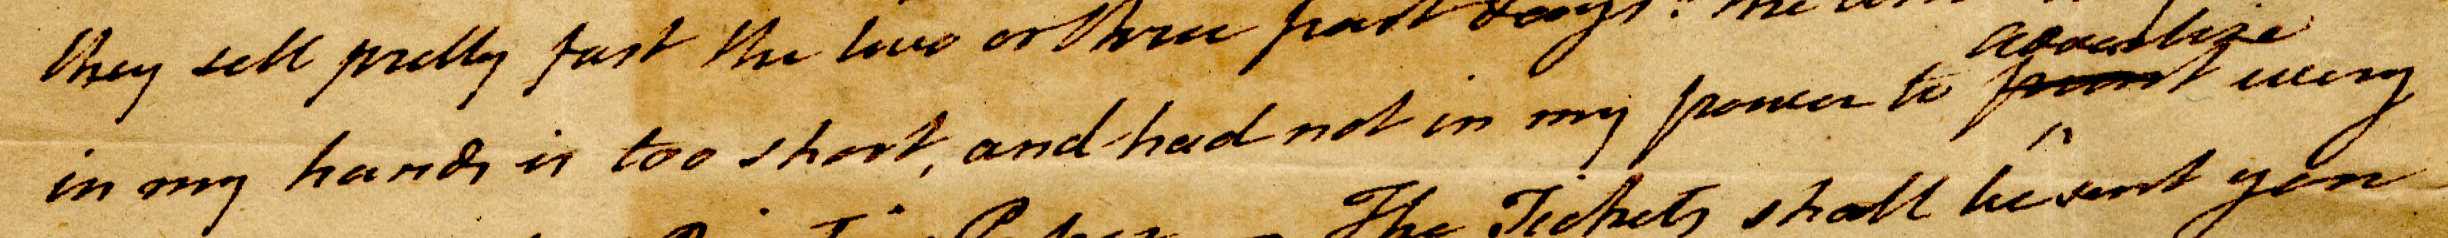in any hands is too short, and had not in my power to ^ every
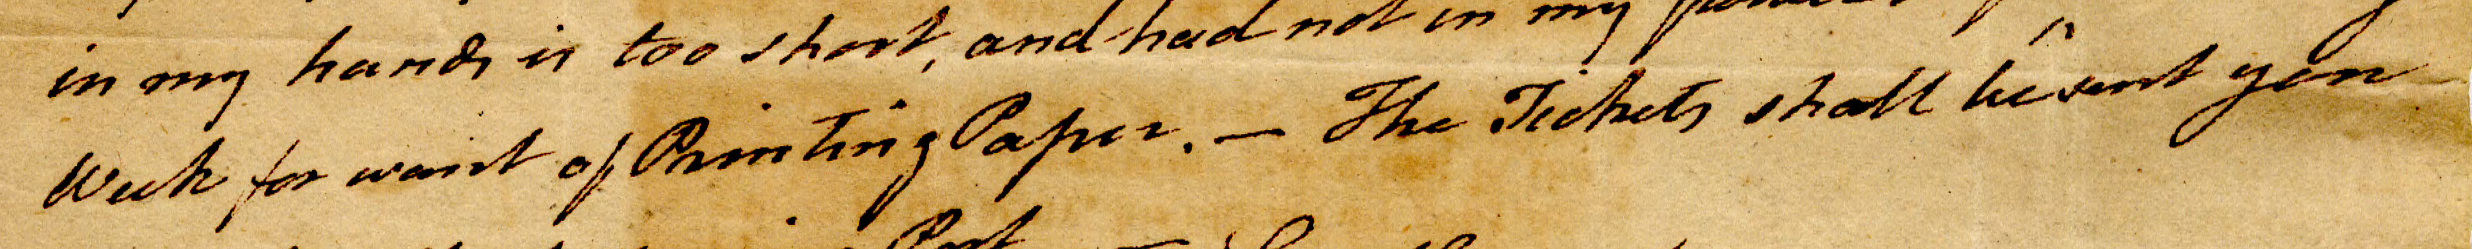week for want of Printing Paper.- The Tickets shall be sent you
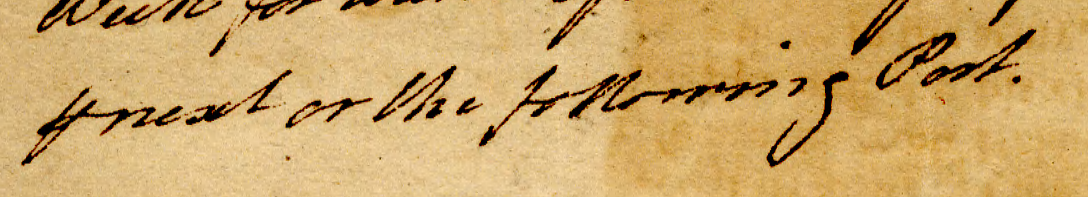y next or the following Post.
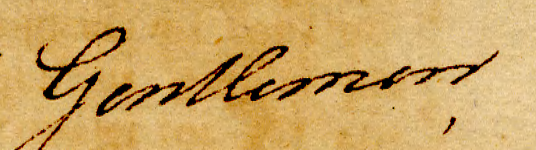Gentlemen,
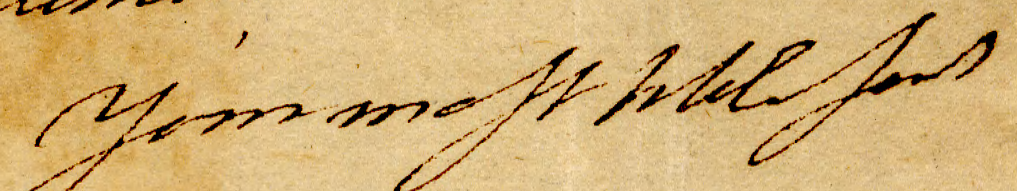your most hbl. Servt
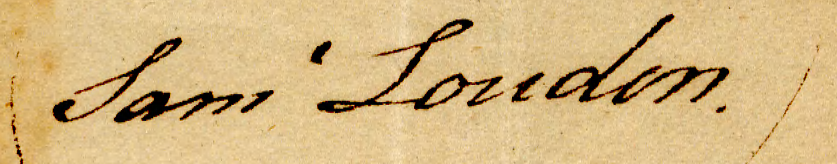Sam^l Loudon.
